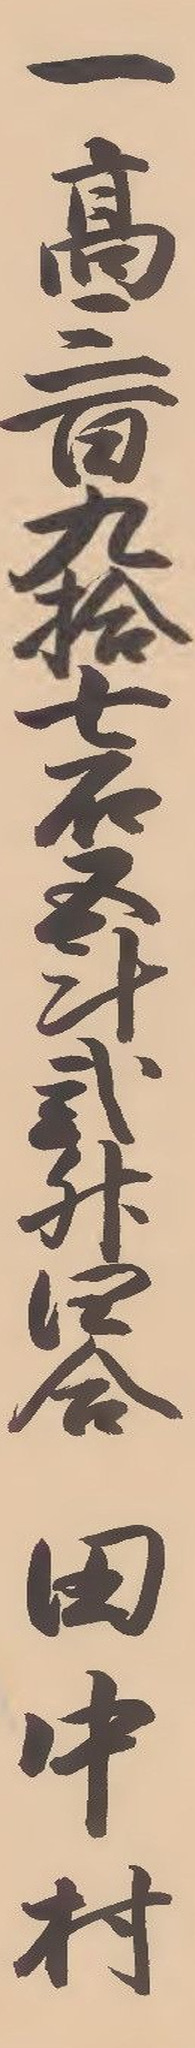一高三百九拾七石五斗弐升四合田中村
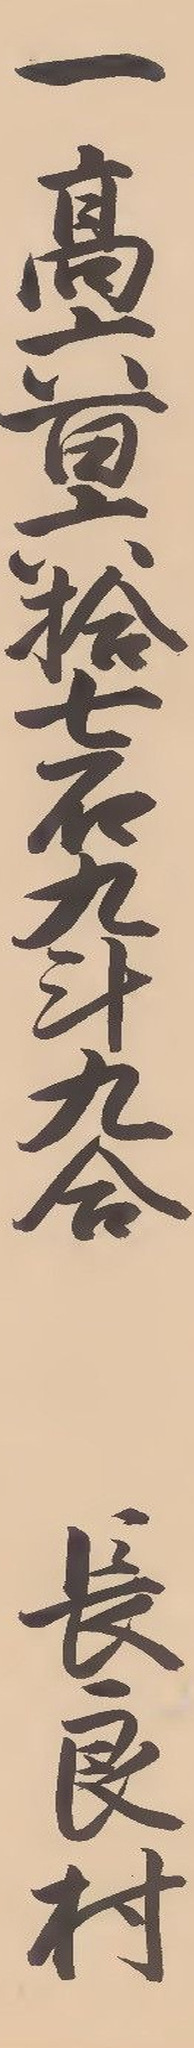一高六百六拾七石九斗九合長良村

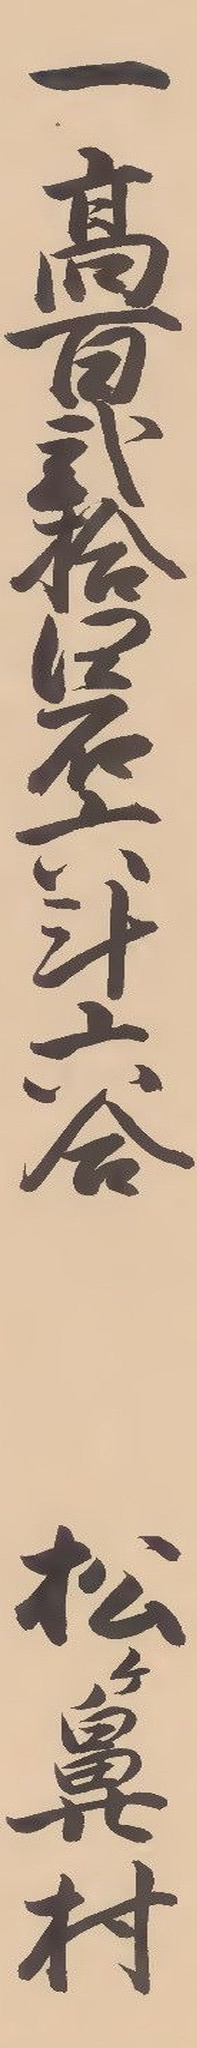一高百弐拾四石六斗六合松ヶ鼻村
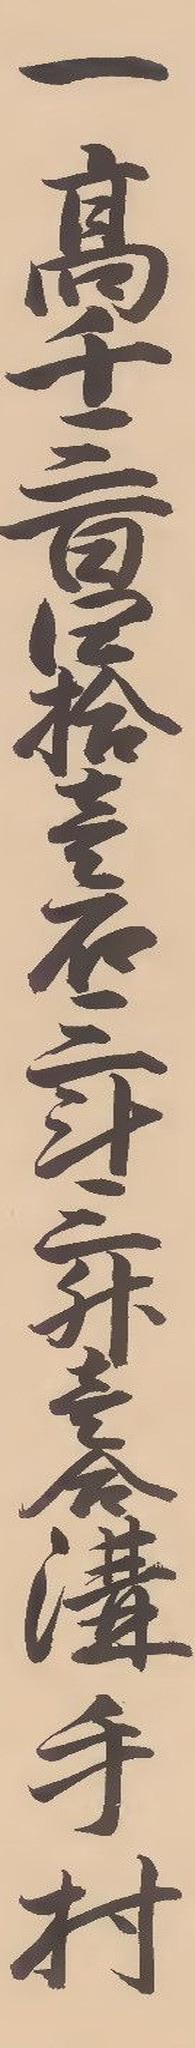一高千三百四拾壱石三斗三升壱合溝手村
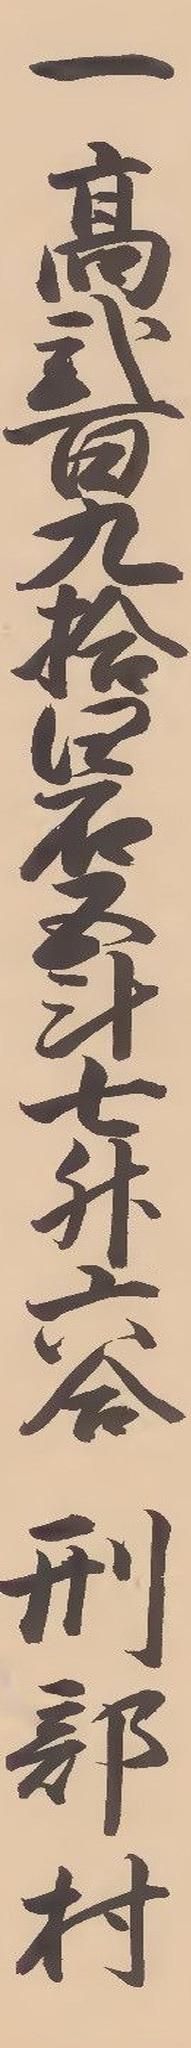一高弐百九拾四石五斗七升六合刑部村
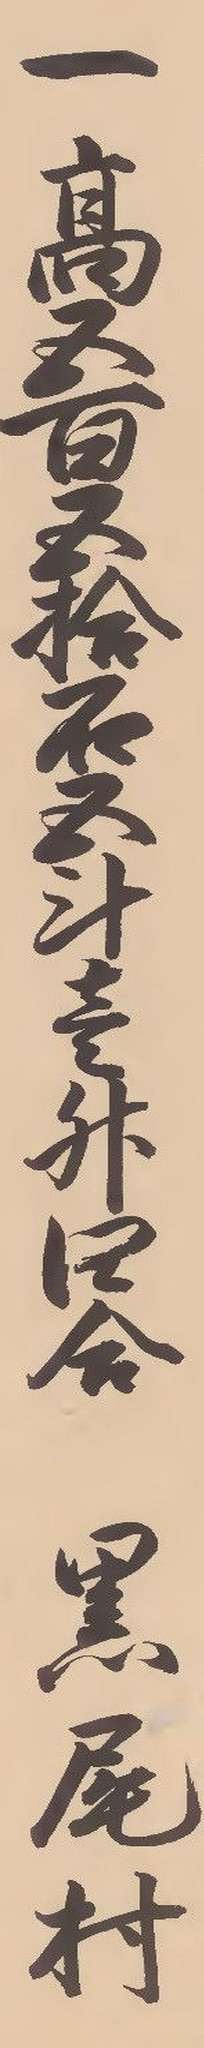一高五百五拾石五斗壱升四合黒尾村
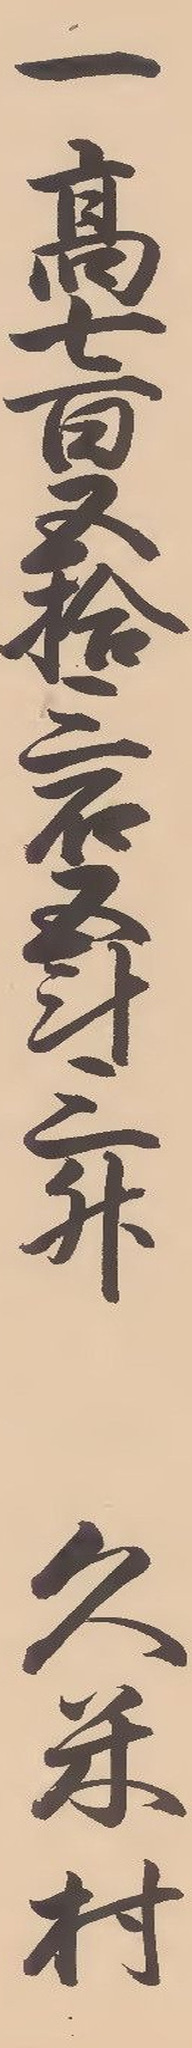一高七百五拾三石五斗三升久米村
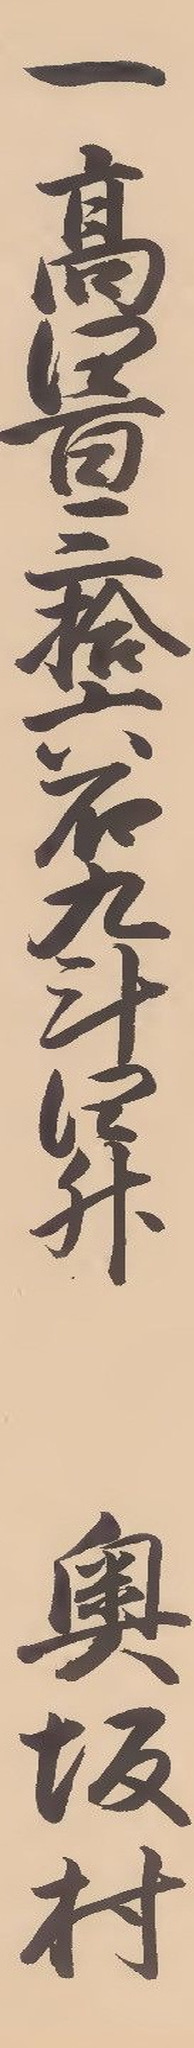一高四百三拾六石九斗四升奥坂村
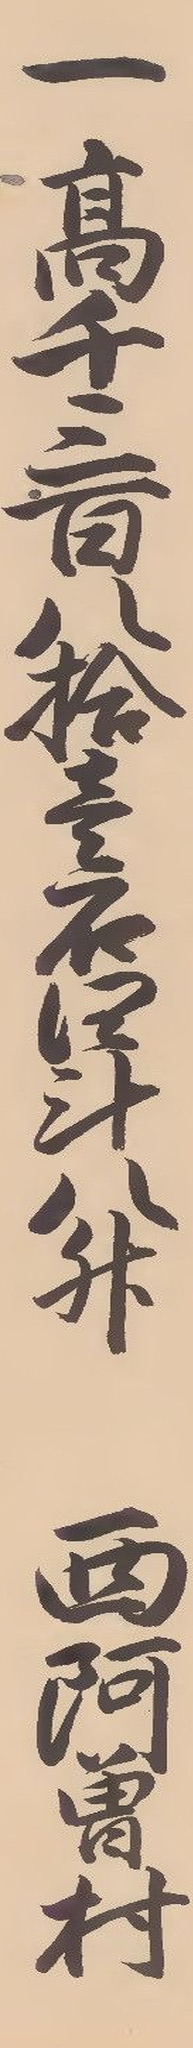一高千三百八拾壱石四斗八升西阿曽村

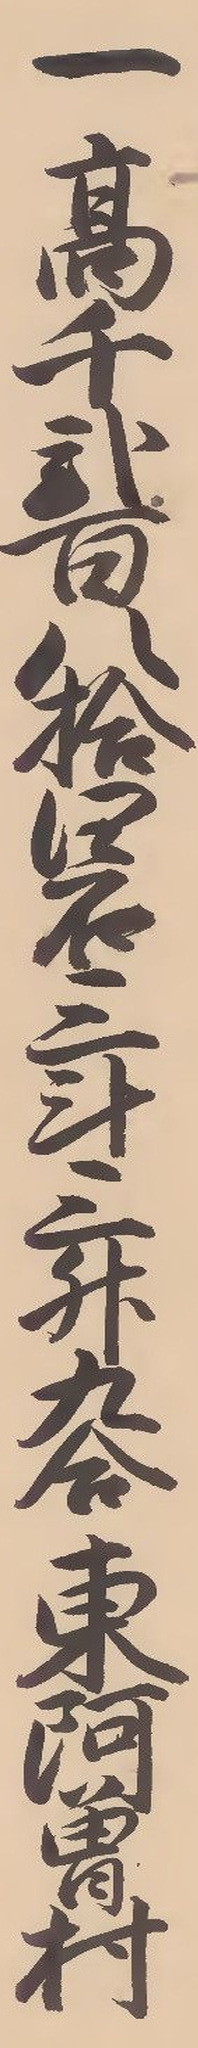一高千弐百八拾四石三斗三升九合東阿曽村
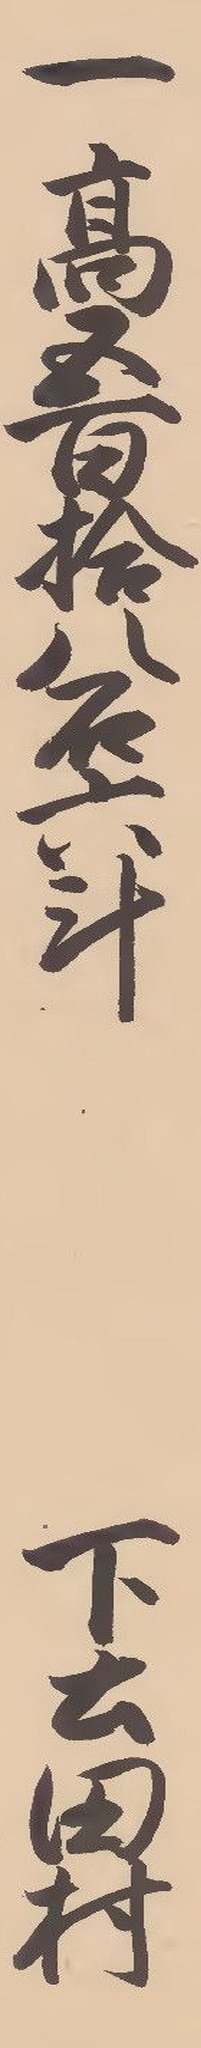一高五百拾八石六斗下土田村
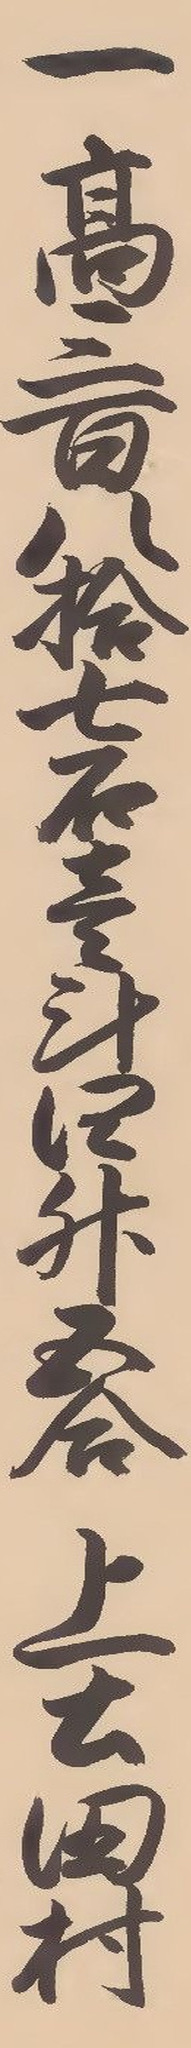一高三百八拾七石壱斗四升五合上土田村
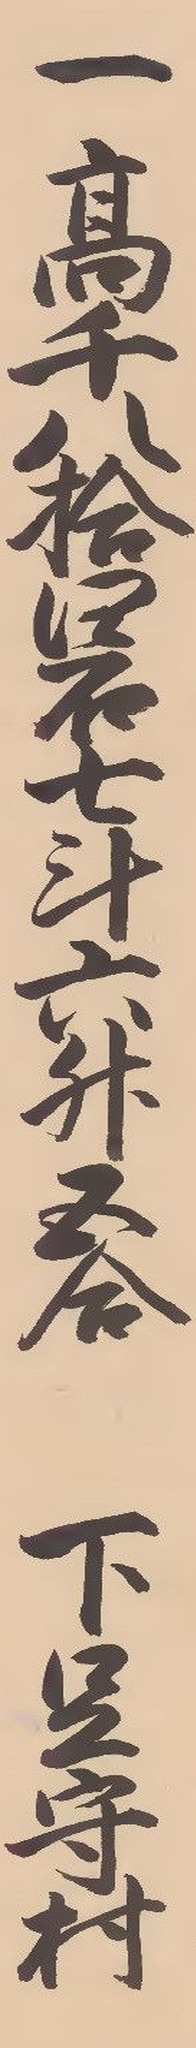一高千八拾四石七斗六升五合下足守村
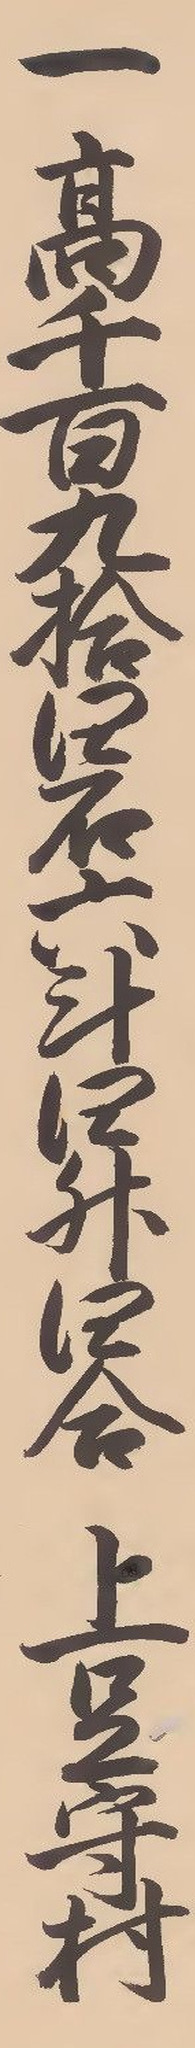一高千百九拾四石六斗四升四合上足守村
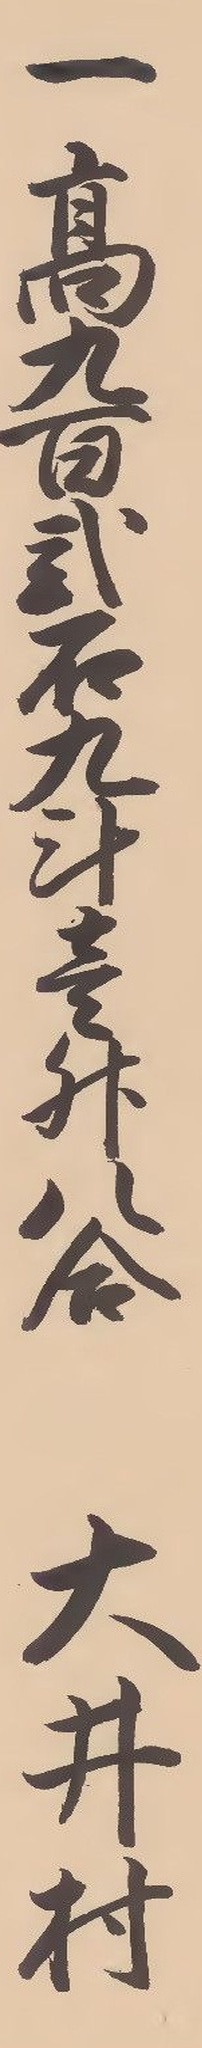一高九百弐石九斗壱升八合大井村
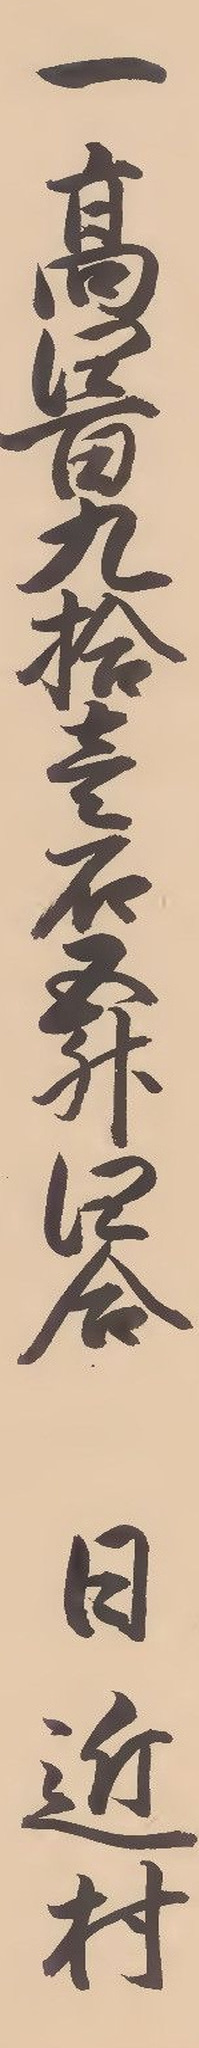一高四百九拾壱石五升四合日近村
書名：備中国郷帳
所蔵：国立公文書館 National Archives of Japan
